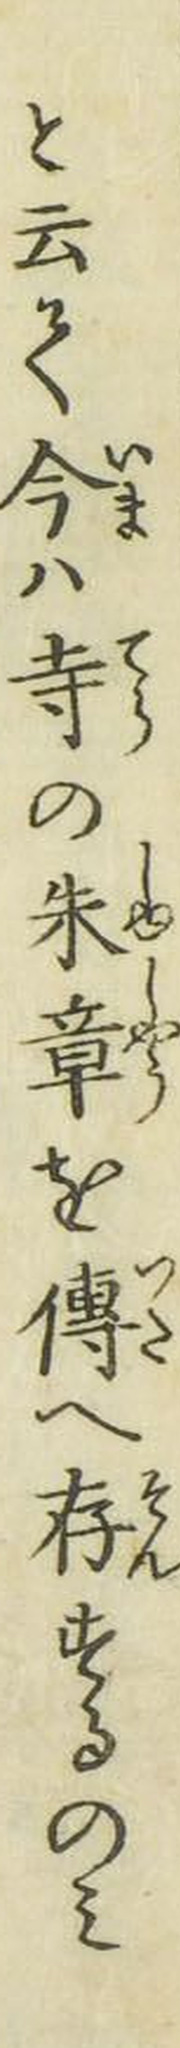と云て今は寺の朱章を傳へ存するのみ
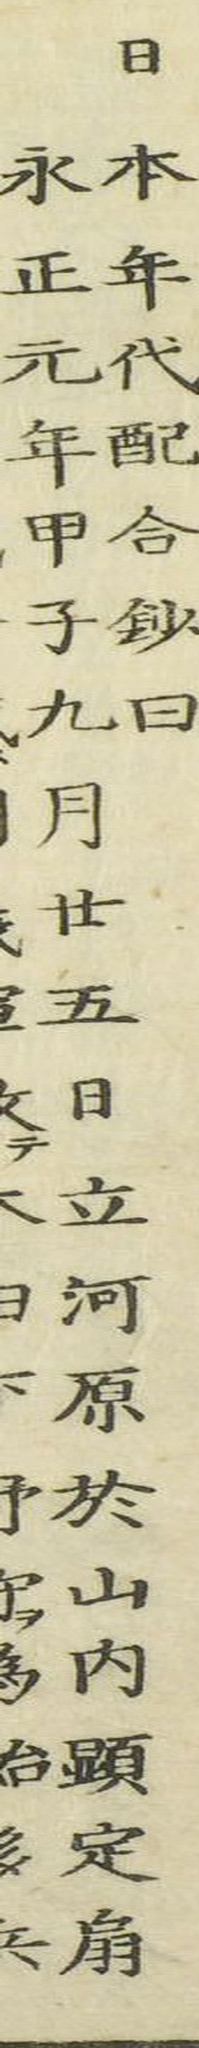永正元年甲子九月廿五日立河原於山内顕定扇
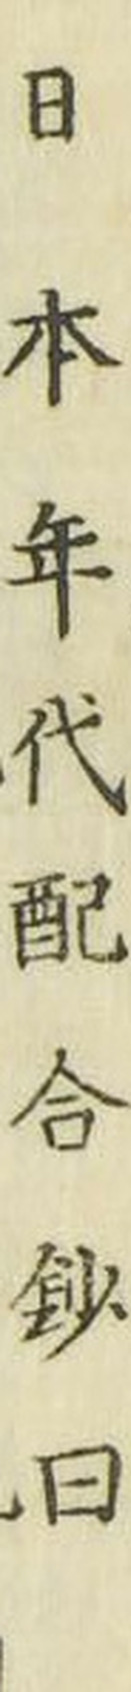日本年代配合鈔曰
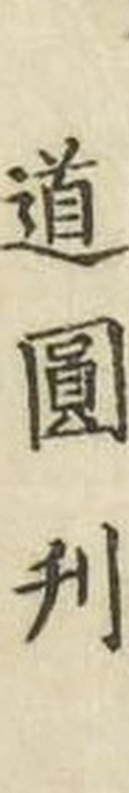道圓刊
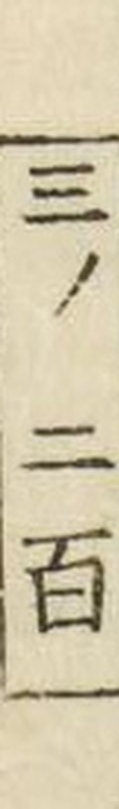三ノ二百
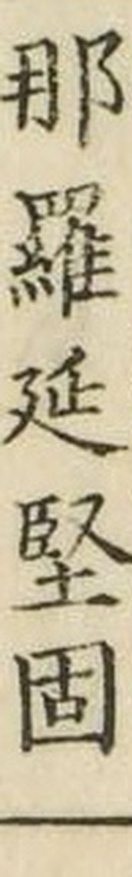那羅延堅固
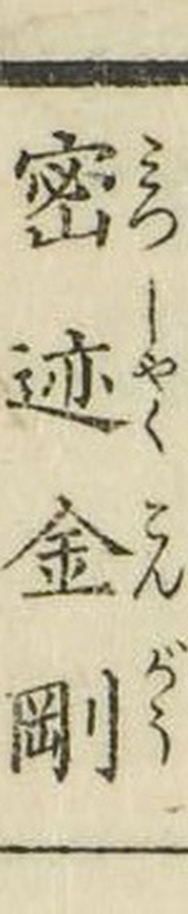密迹金剛

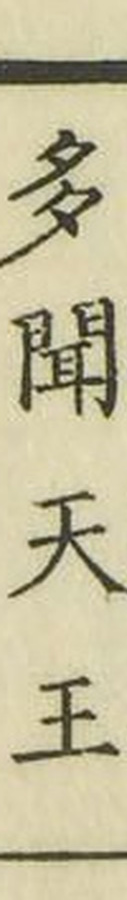多聞天王
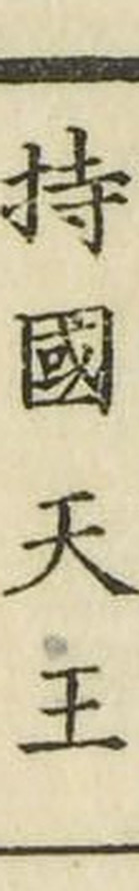持国天王
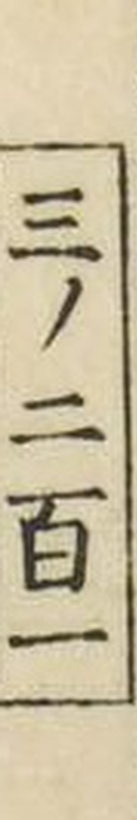三ノ二百一
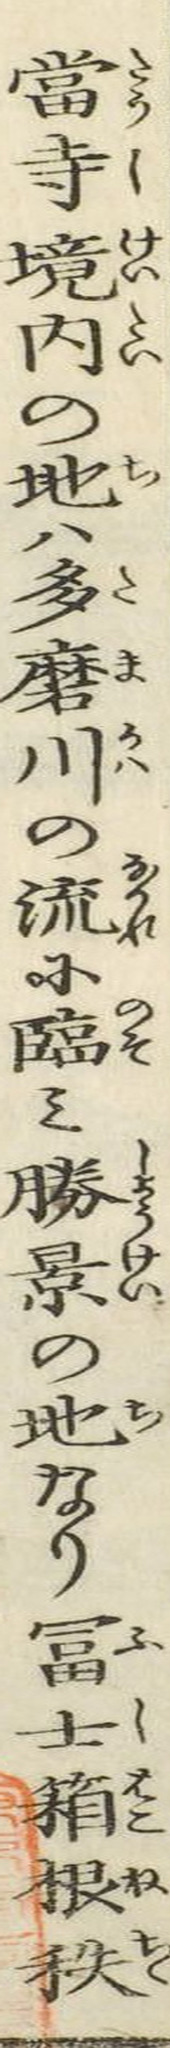当寺境内の地は多磨川の流に臨み勝景の地なり富士箱根秩
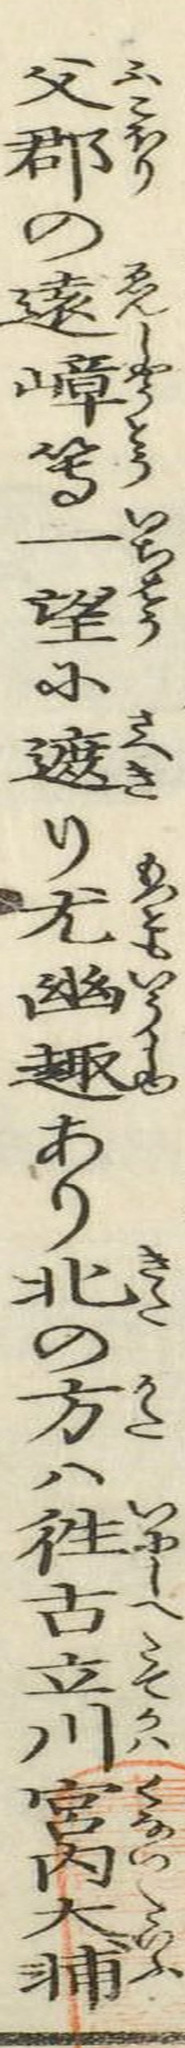父郡の遠嶂等一望に遮り尤幽趣あり北の方は往古立川宮内大輔
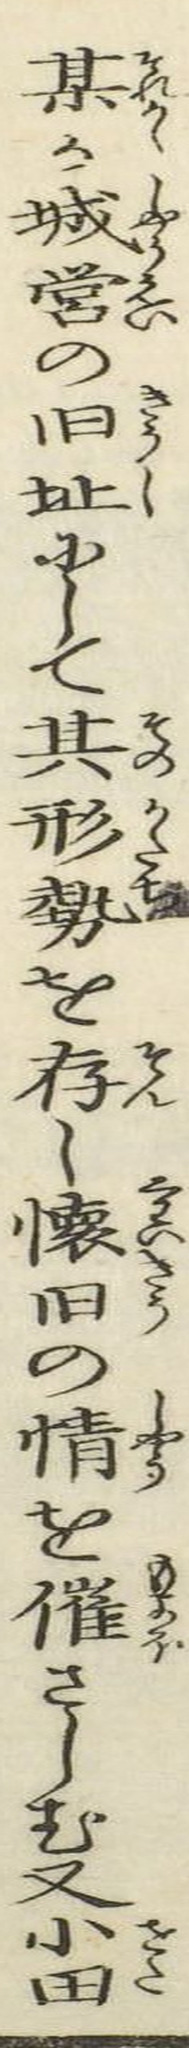某か城営の旧址にして其形勢を存し懐旧の情を催さしむ又小田
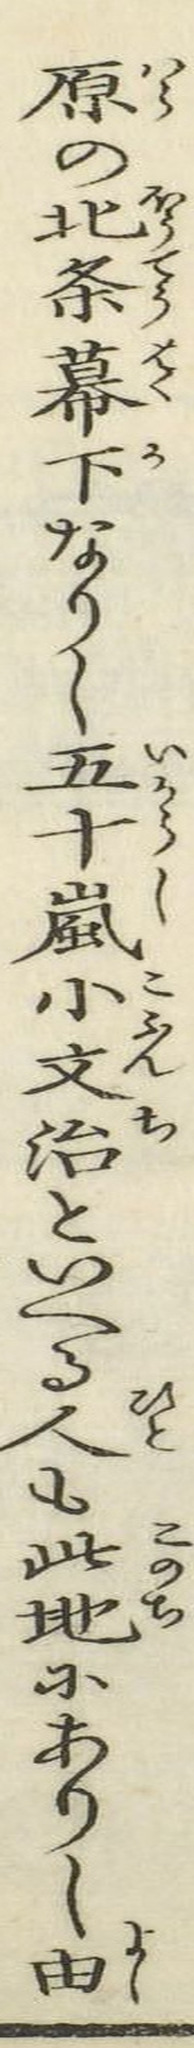原の北条幕下なりし五十嵐小文治といへる人も此地にありし由
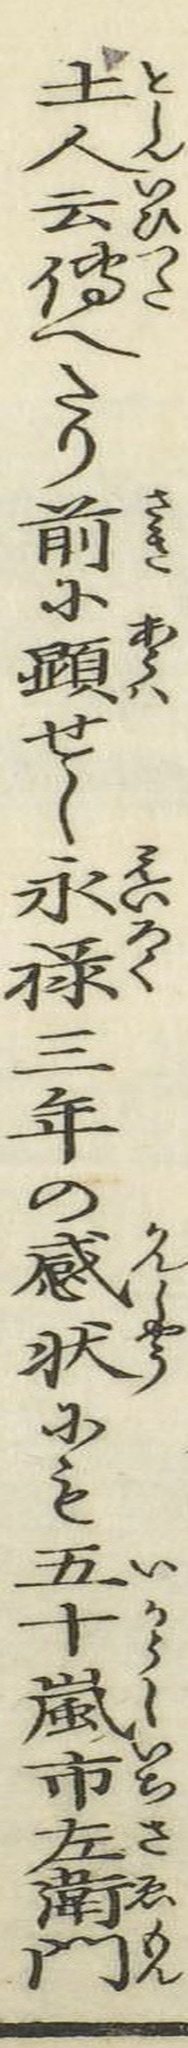土人云傳へたり前に顕せし永禄三年の感状にも五十嵐市左衛門
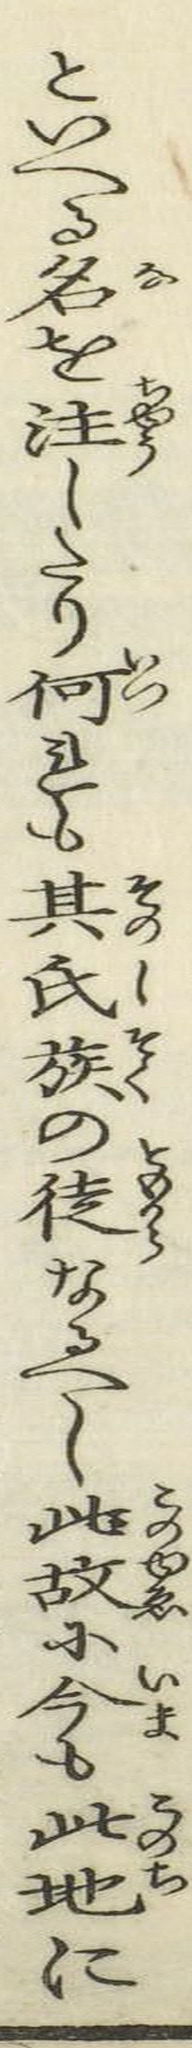といへる名を注したり何れも其氏族の徒なるへし此故に今も此地に
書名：江戸名所図会 20巻 巻之10
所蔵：東京学芸大学教育コンテンツアーカイブ
